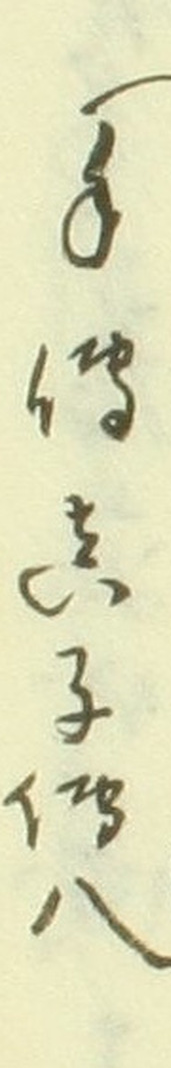手伝真子伝八
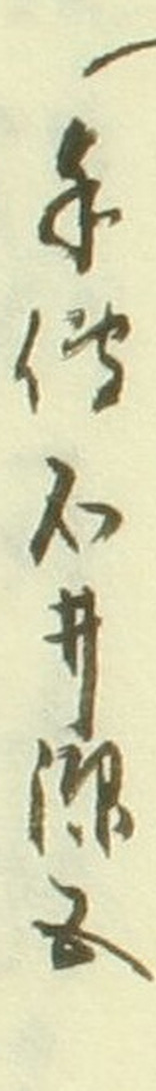手伝石井源五
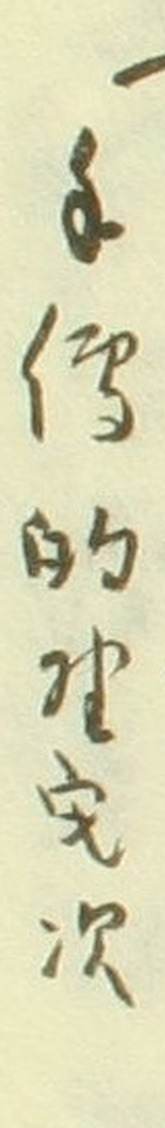手伝的野宅次
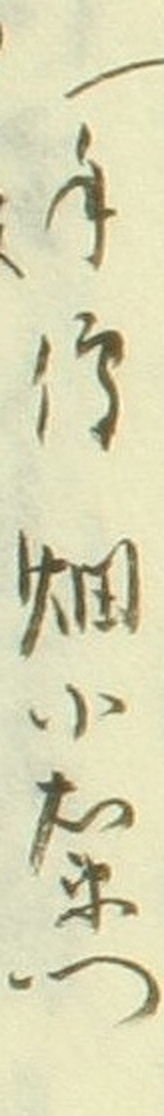手伝畑小右衛門
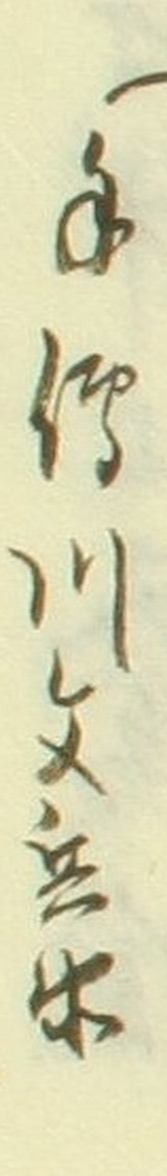手伝川文兵衛

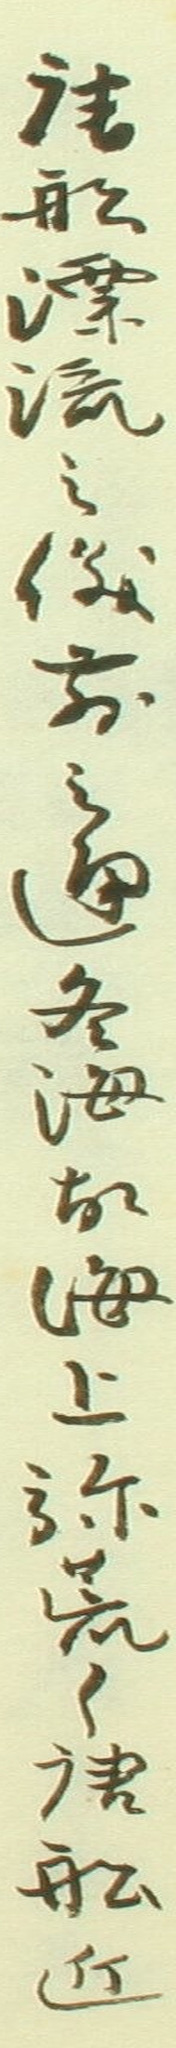唐船漂流之儀前之通冬海故海上弥荒荒唐船近
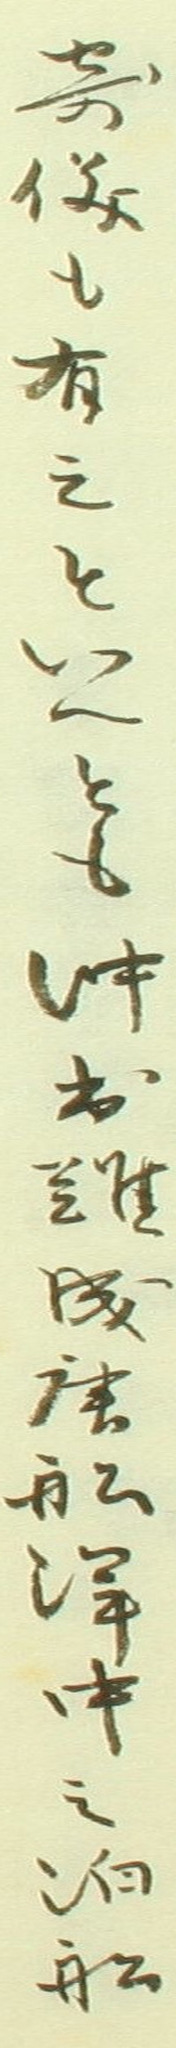寄儀も有之といへとも沖出難成唐船洋中の泊船
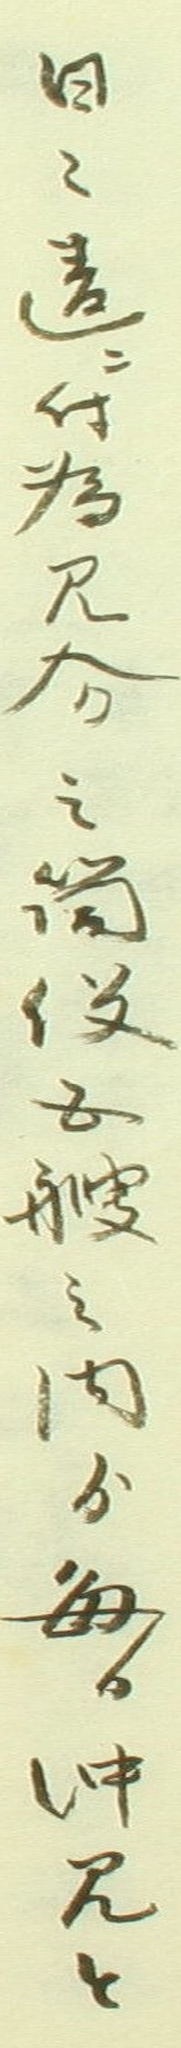日々遭に付為見分之筒役五艘之内ゟ毎日沖見と
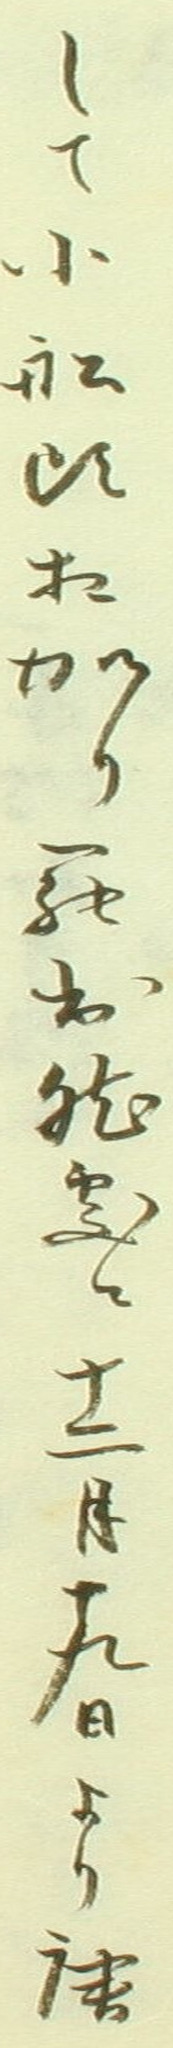して小船頭相加り罷出然處に十二月十九日より唐
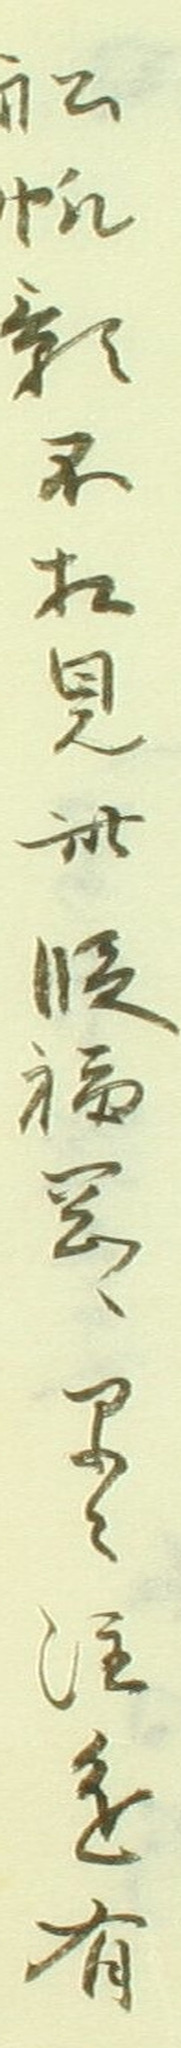船帆類不相見此段福岡へ早々注進有
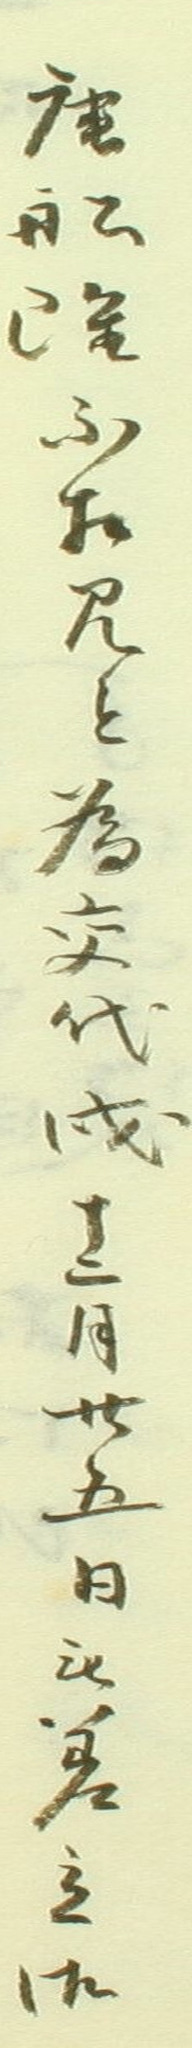一唐船？不相見と為交代戌十二月廿五日被差立御
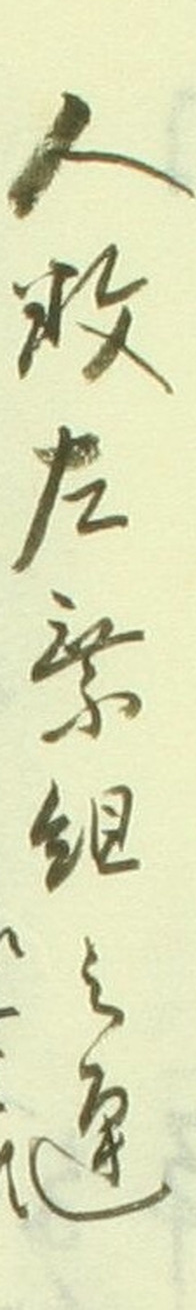人数左乗組の連
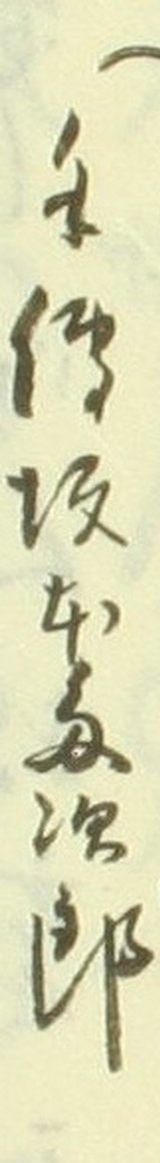手伝坂本多次郎
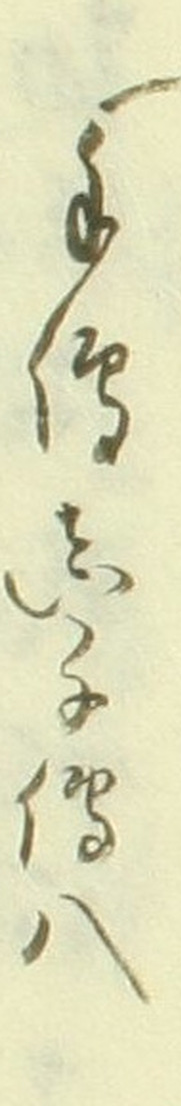手伝真子伝八
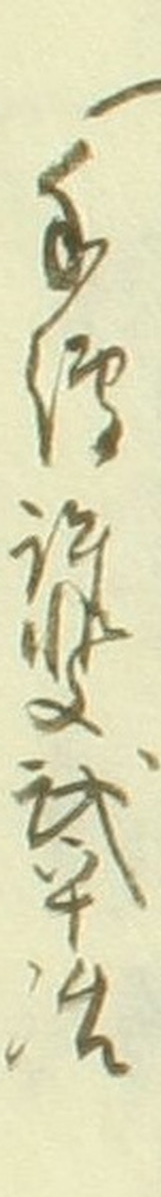手伝許斐武平治
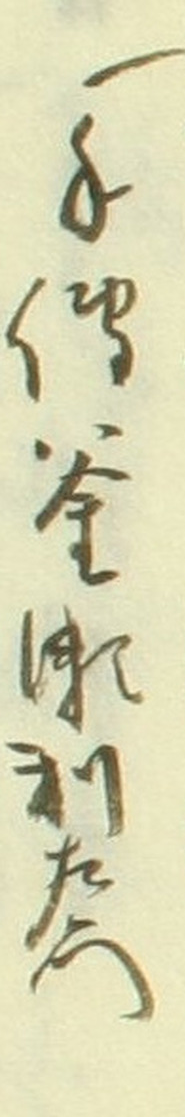手伝釜瀬利左衛門
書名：唐船漂流記 三
